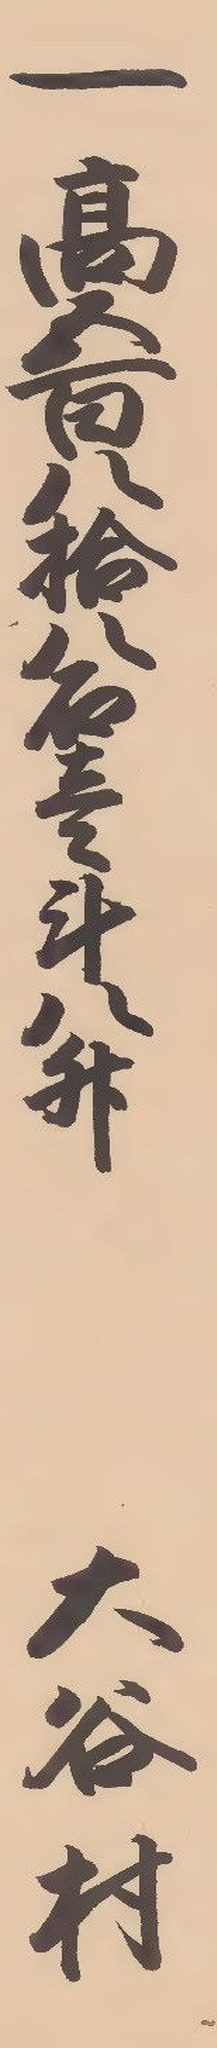一髙五百八拾八石壱斗八升大谷村
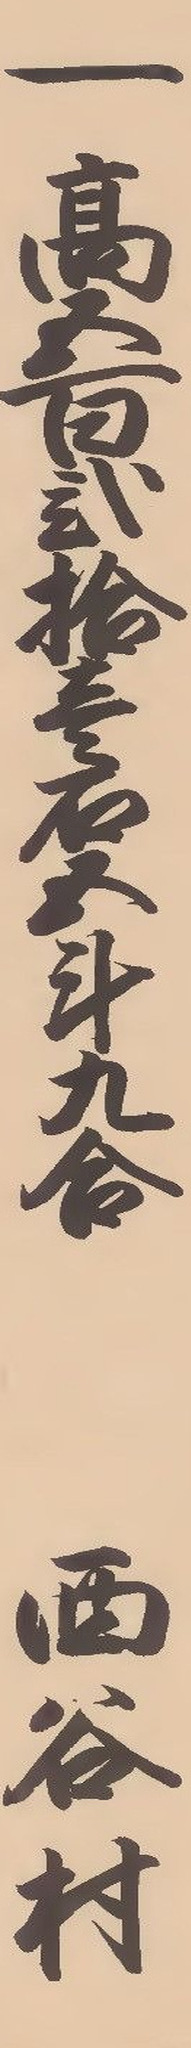一髙五百弐拾壱石五斗九合西谷村
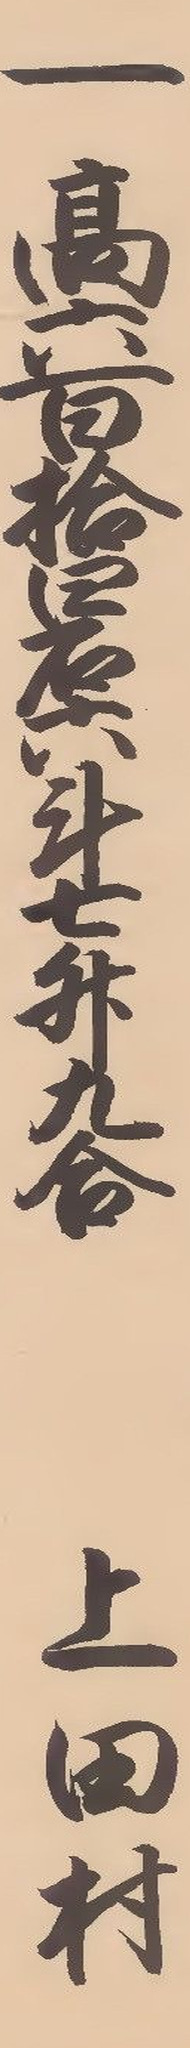一髙六百拾四石六斗七升九合上田村
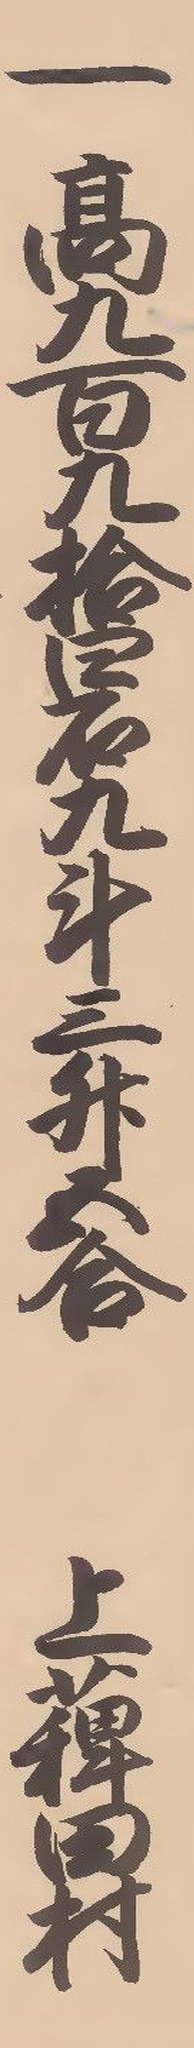一髙九百九拾四石九斗三升五合上薭田村
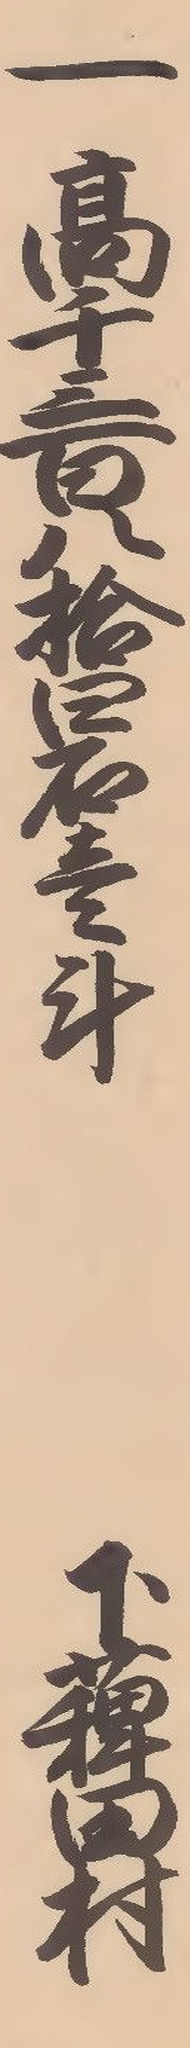一髙千三百八拾四石壱斗下薭田村
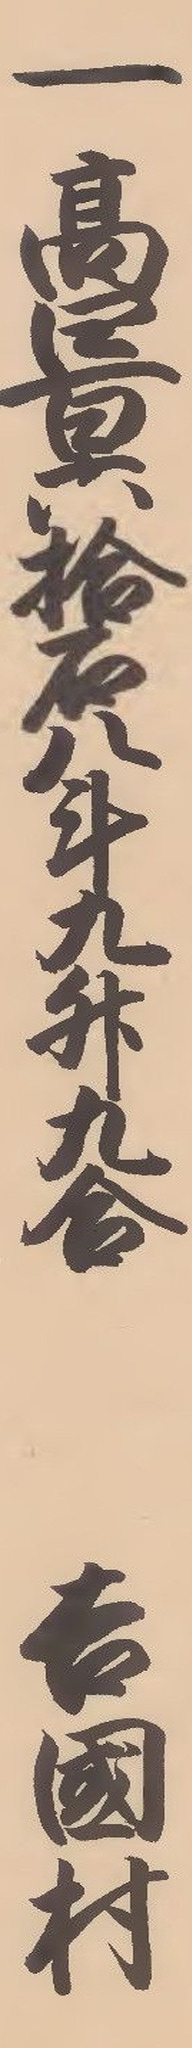一髙四百六拾石八斗九升九合吉國村
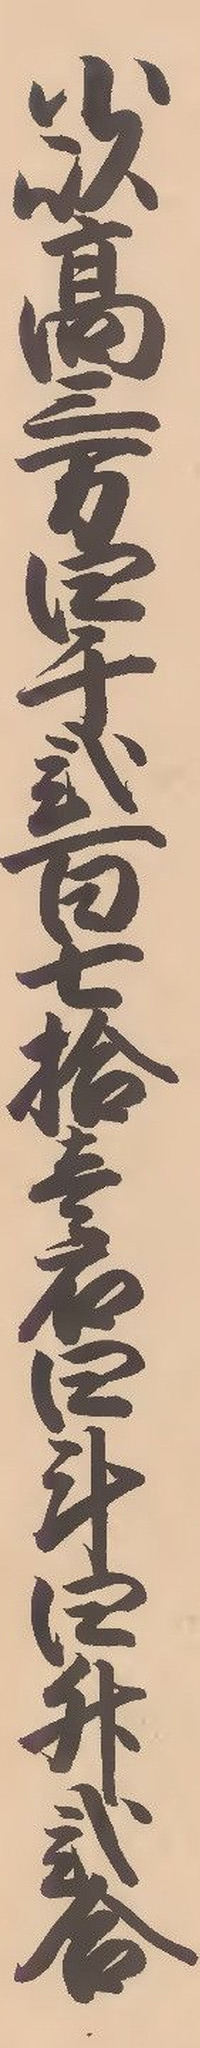小以髙三万四千弐百七拾壱石四斗四升弐合

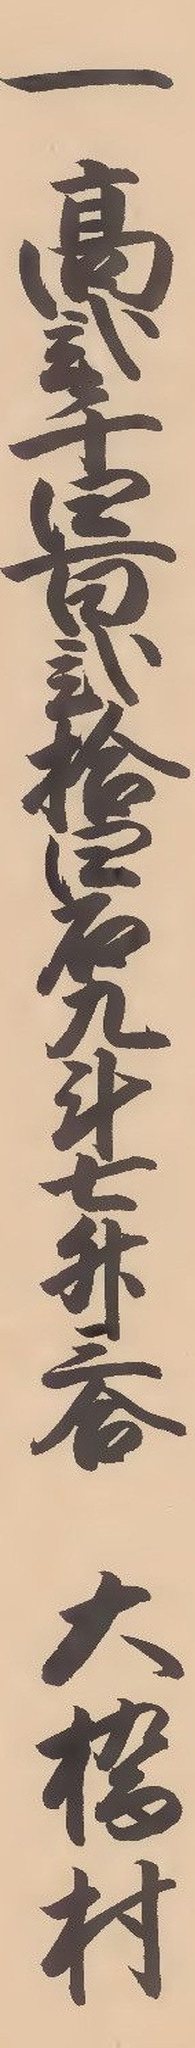一髙弐千四百弐拾四石九斗七升三合大橋村
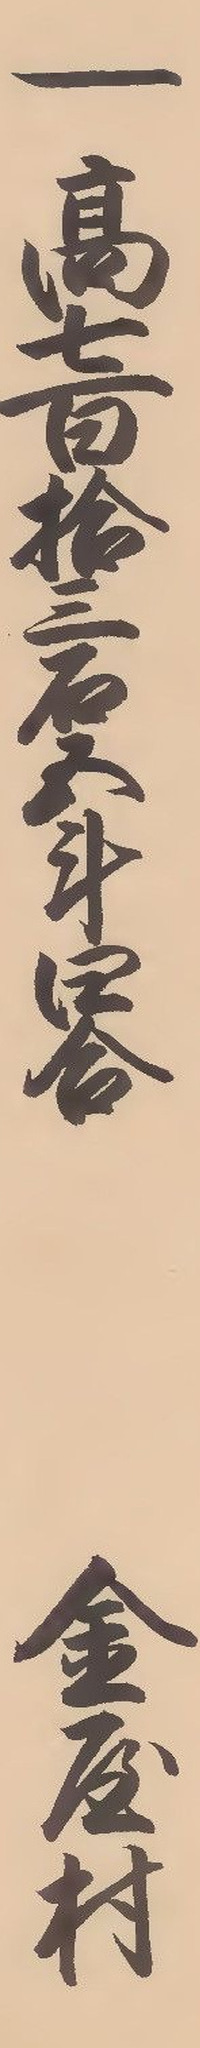一髙七百拾三石五斗四合金屋村
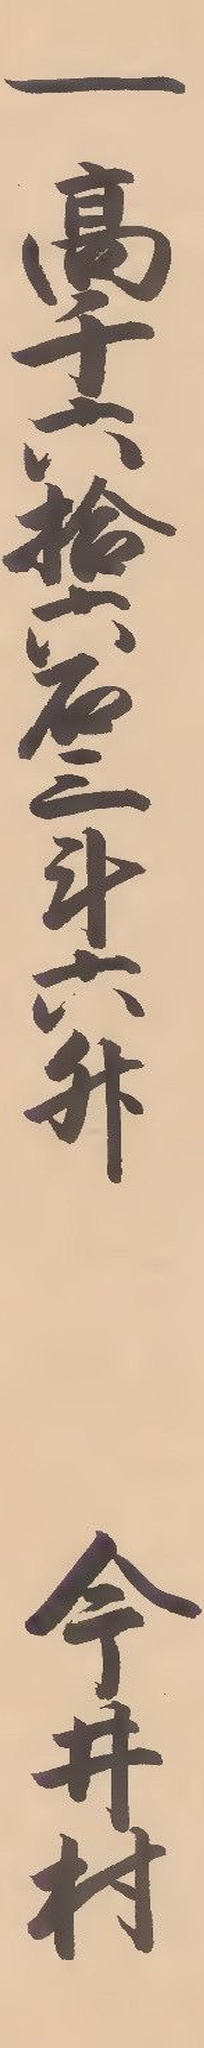一髙千六拾六石三斗六升今井村

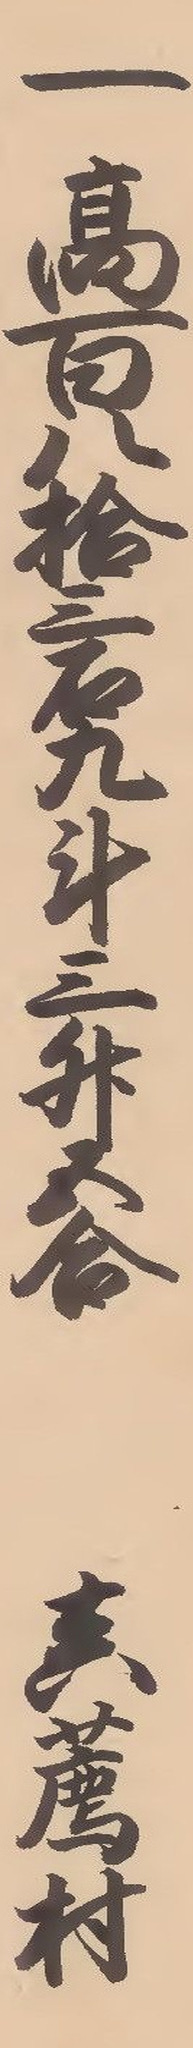一髙百八拾三石九斗三升五合真薦村
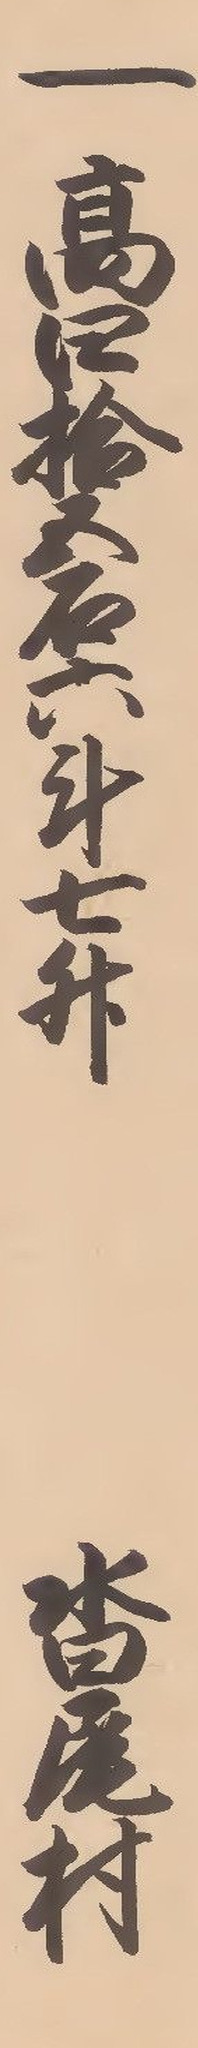一髙四拾五石六斗七升沓尾村
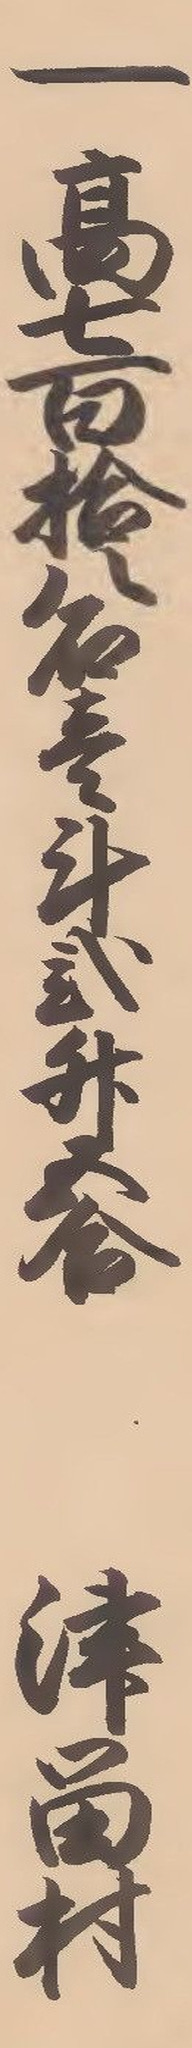一髙七百拾八石壱斗弐升五合津留村
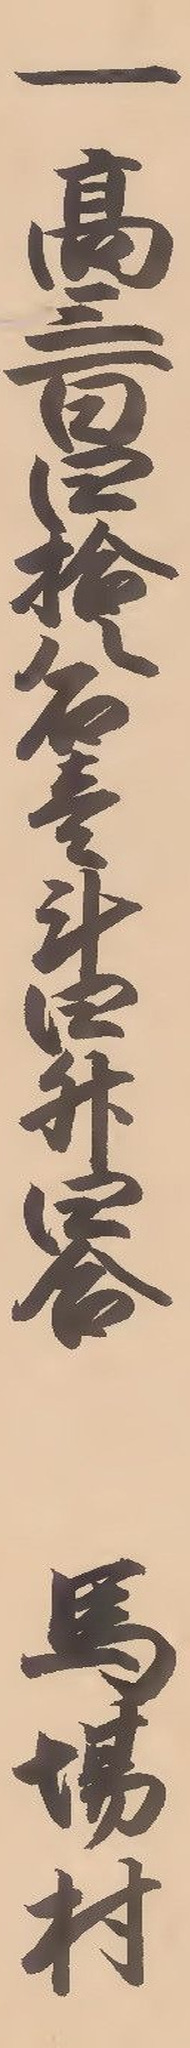一髙三百四拾八石壱斗四升四合馬場村
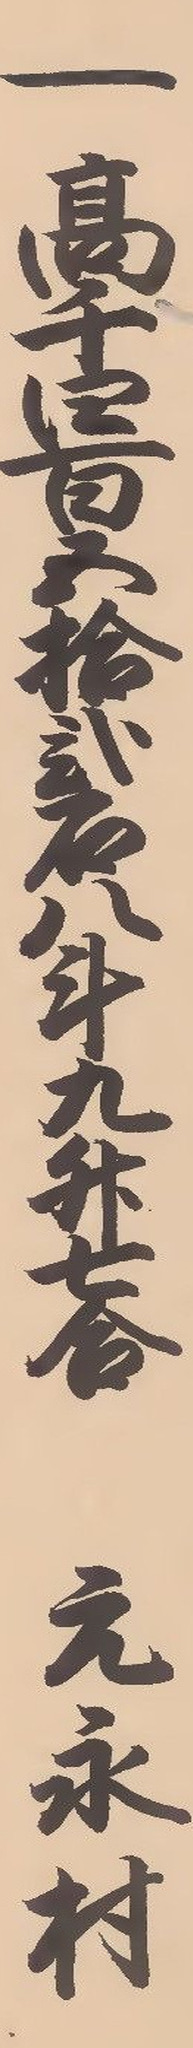一高千四百五拾弐石八斗九升七合元永村
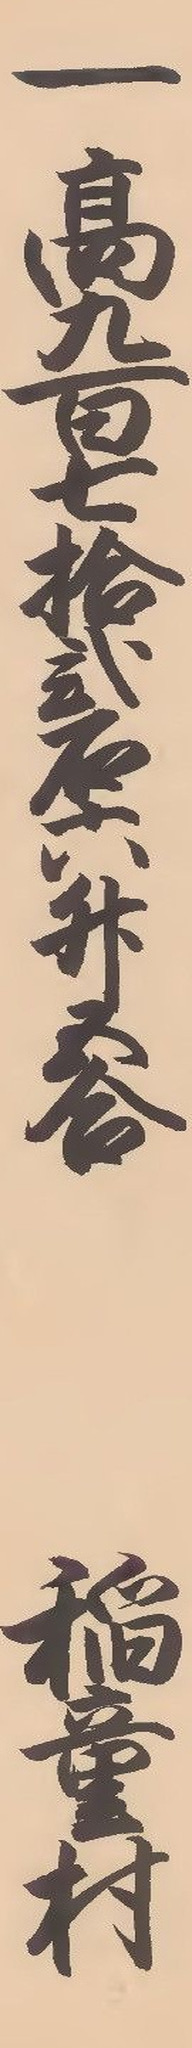一髙九百七拾弐石六升五合稲童村
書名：豊前国郷帳
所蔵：国立公文書館 National Archives of Japan
